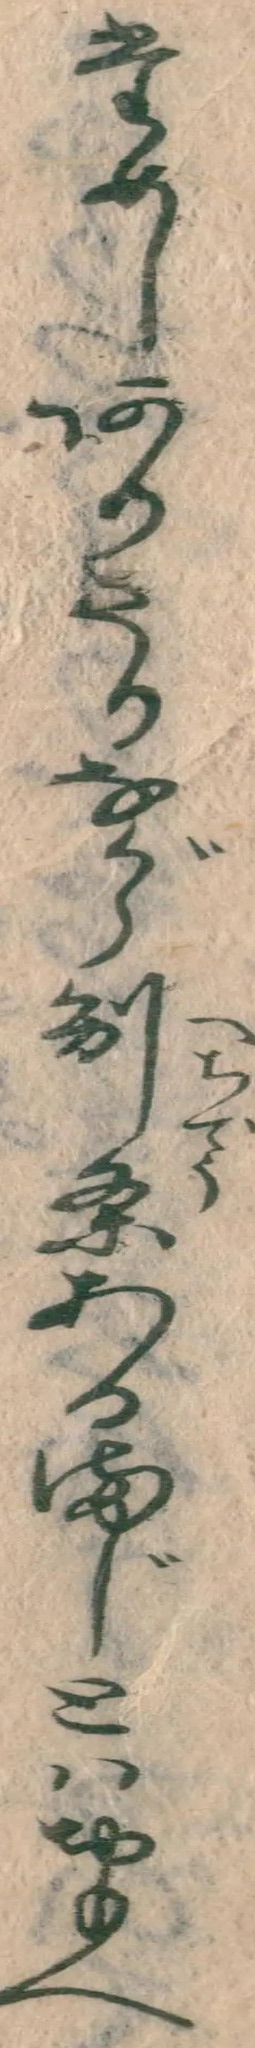ためしありさりながら別条あるまじとはおもへ
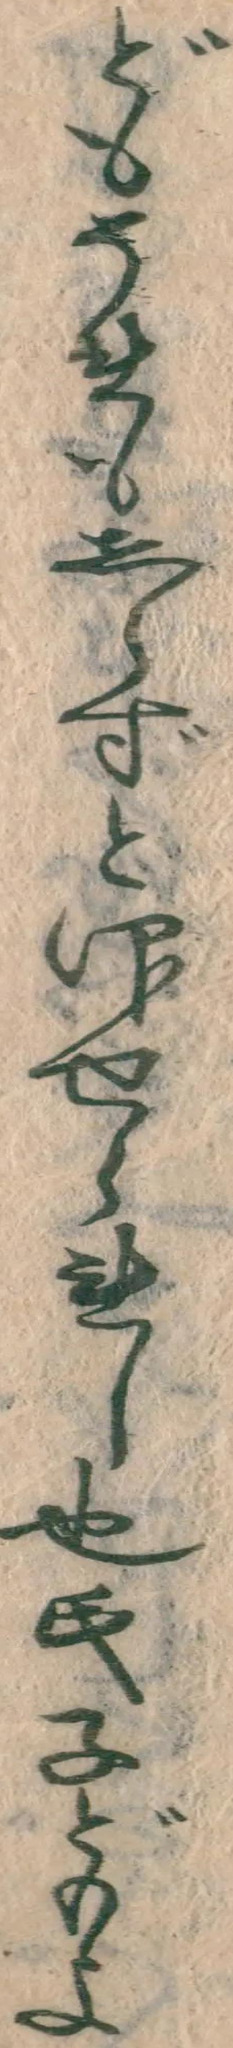どもそれもしらずと報せられし也氏子どもよ
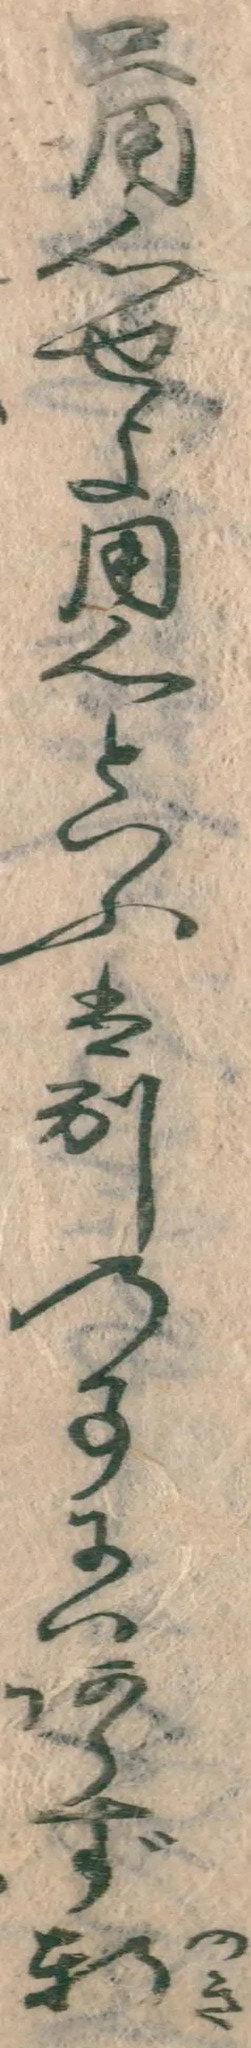只用心せよ用心といふは別の事にはあらず軒
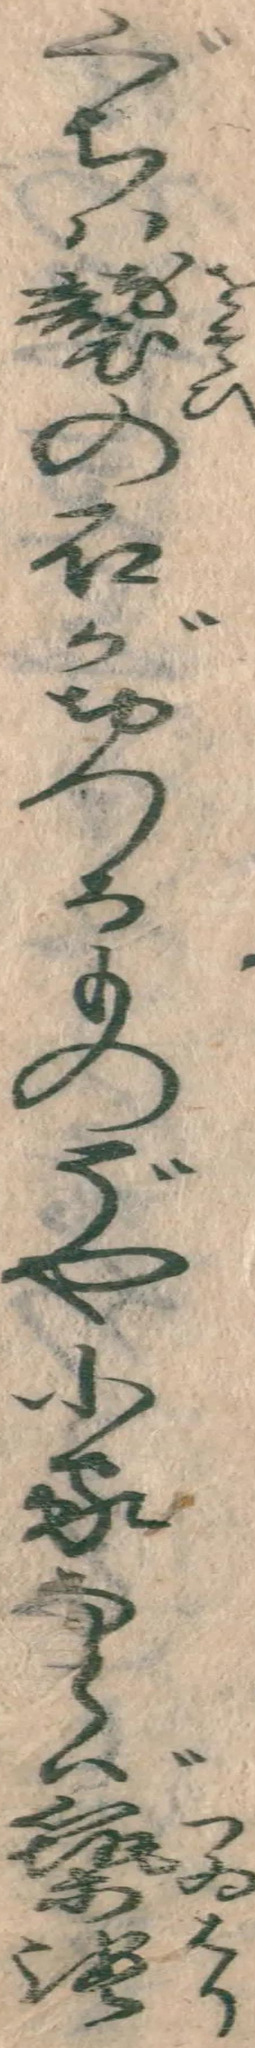ぐちは襲の石がおつるものぞや小家ならば築張
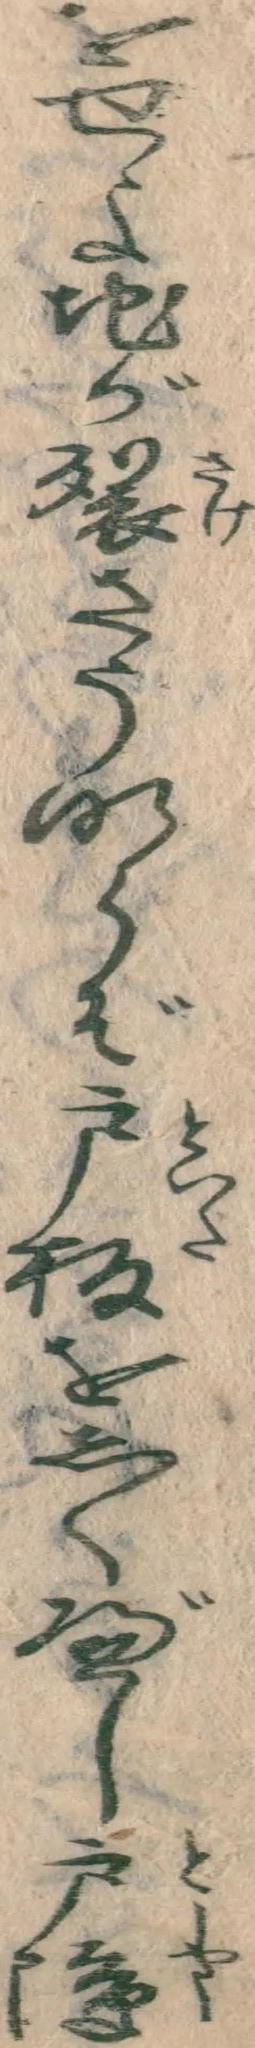をせよ地が裂さうならば戸板をしくべし戸障
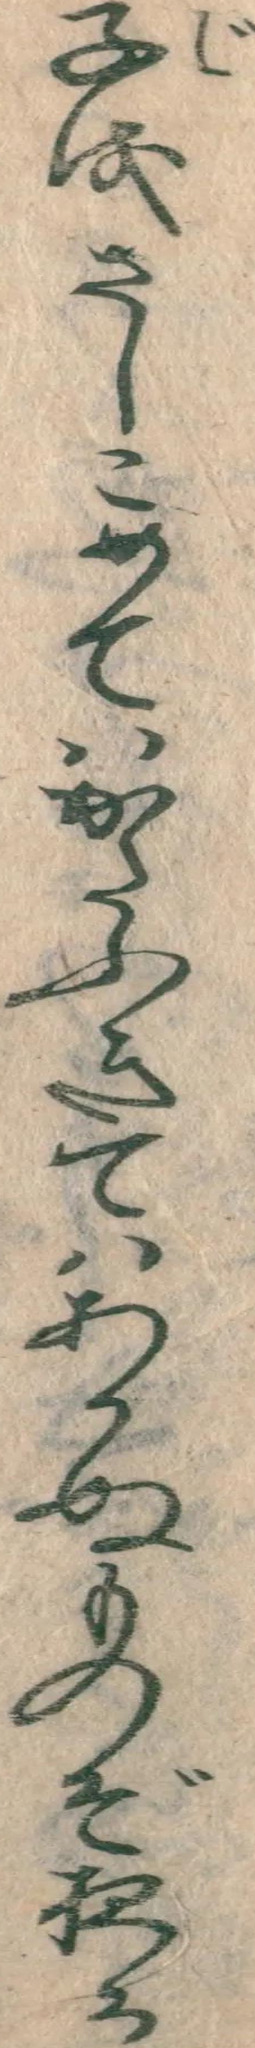子をさしこめてはかたふきてはあかぬものぞ夜る
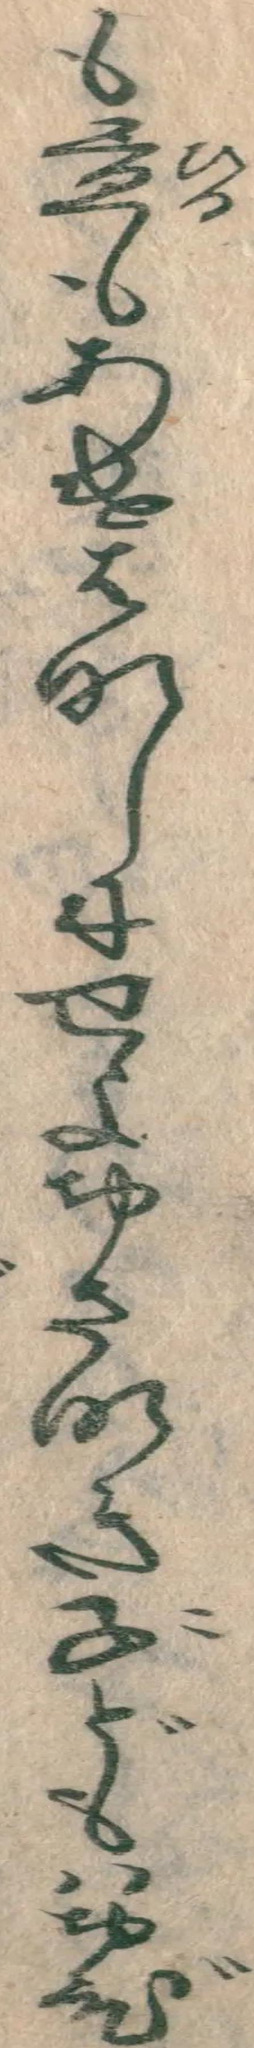も昼もあけはなしにせよおさなき子どもはおび
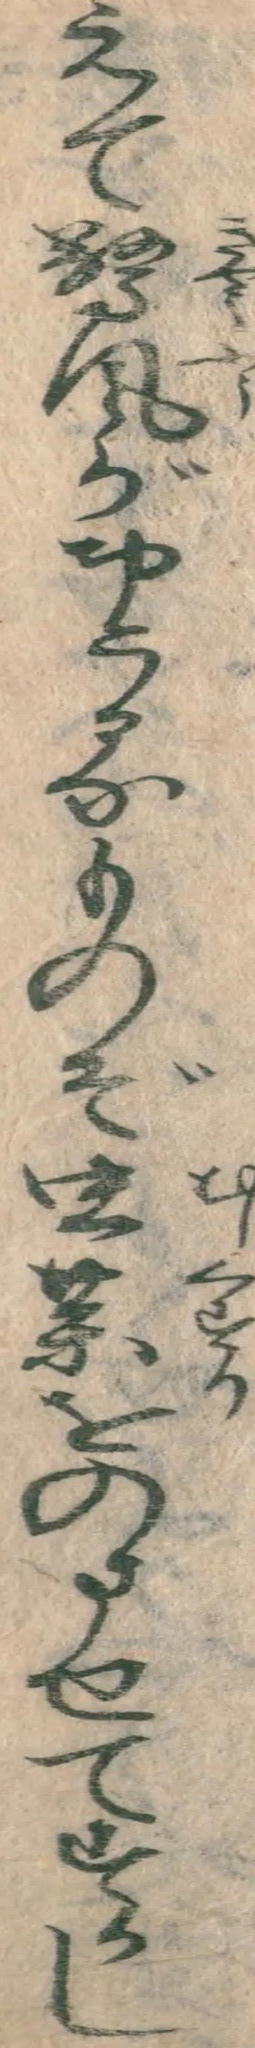えて驚風がおこるものぞ虫薬をのませてすかし
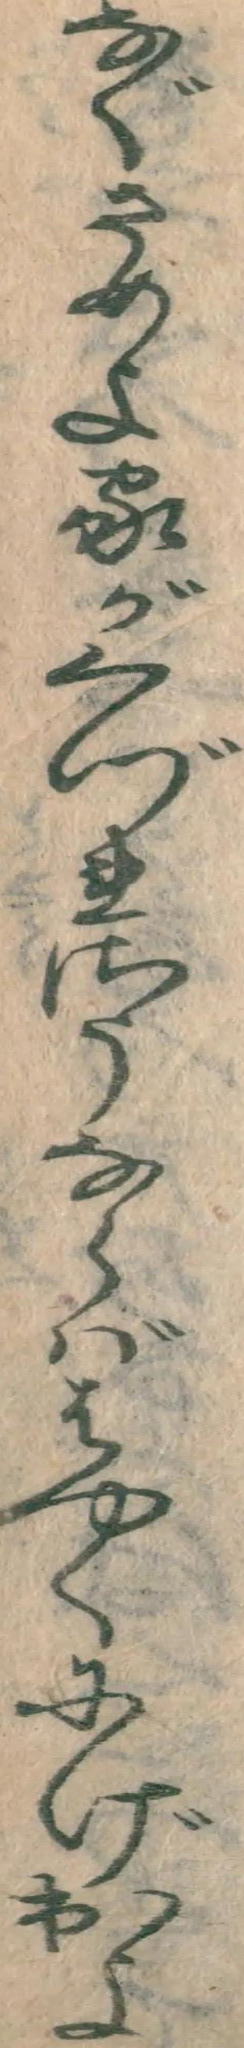なぐさめよ家がくづれさうならばはやくにげ出よ

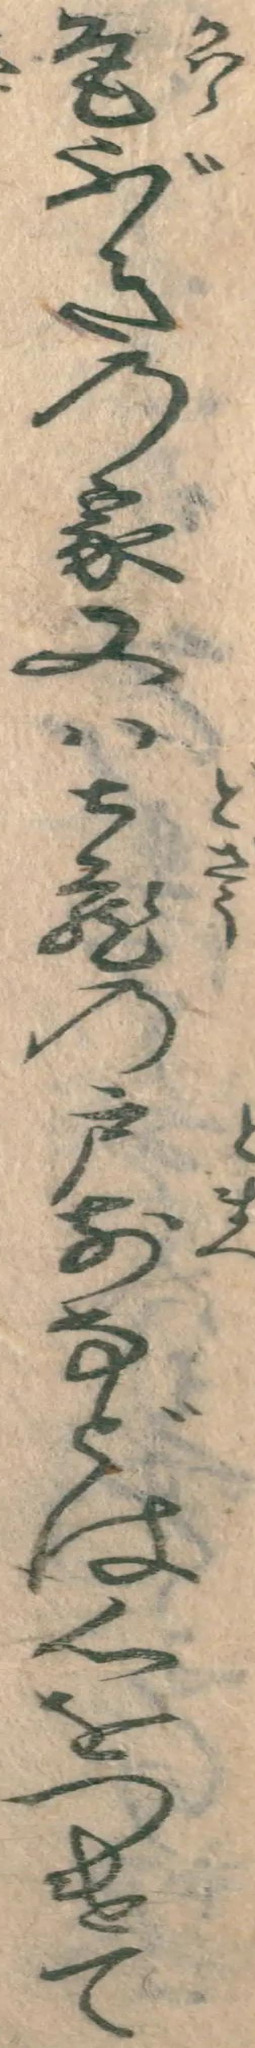瓦ぶきの家又は土蔵の戸前などは心をつけて
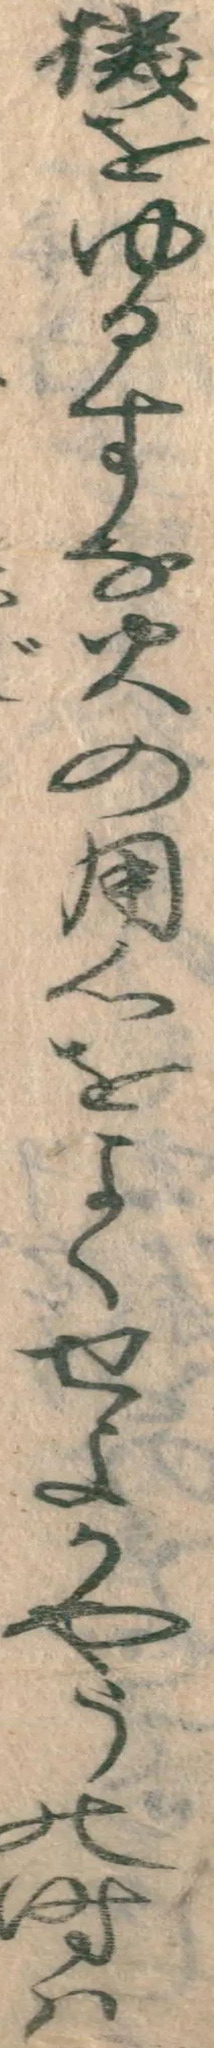機をゆるすな火の用心をよくせよかやうの時は
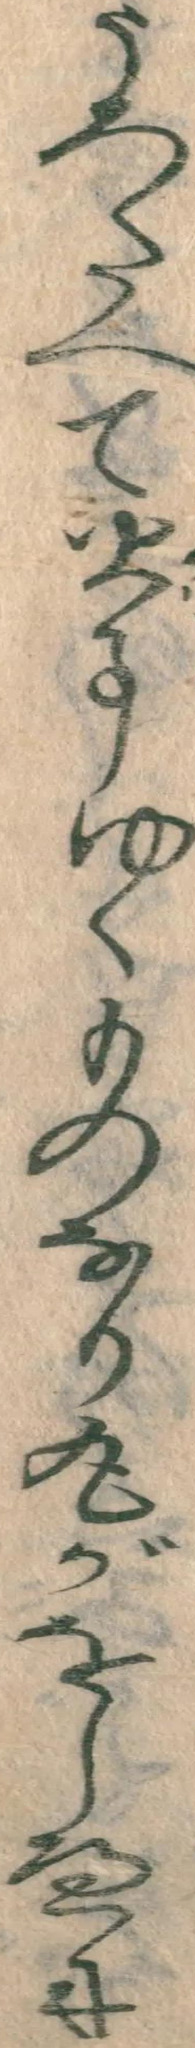うろたへて火事ゆくものなり丸がをしへに
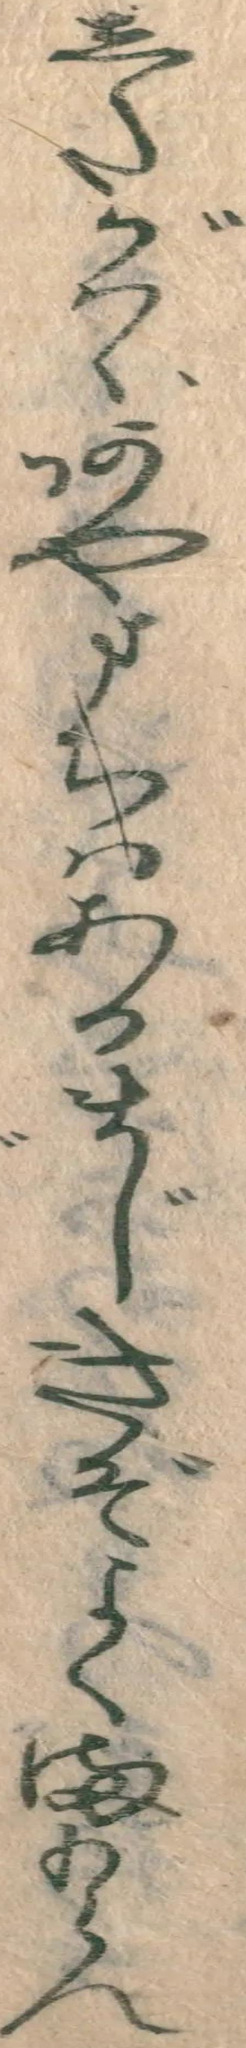したがはゝあやまちはあるまじきぞよくまもらん
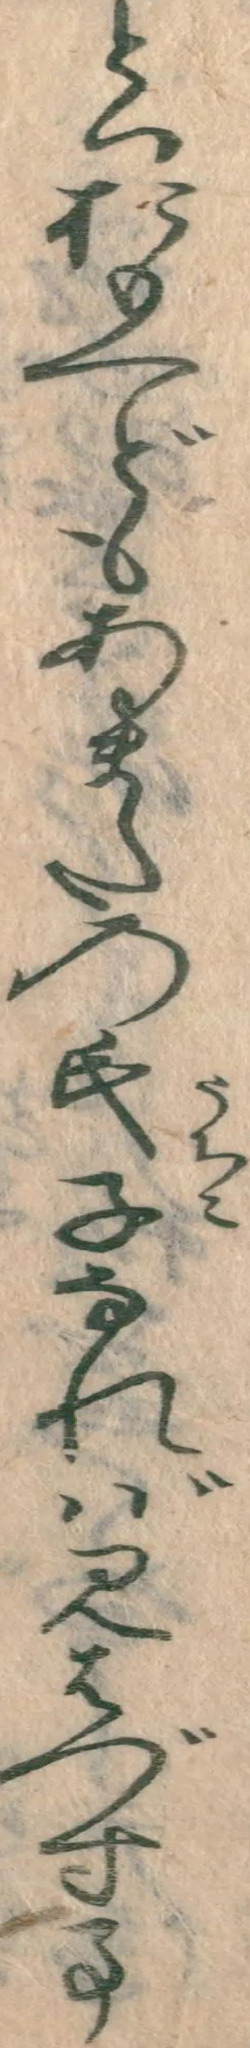とはおもへどもあまたの氏子なれば見はづす事
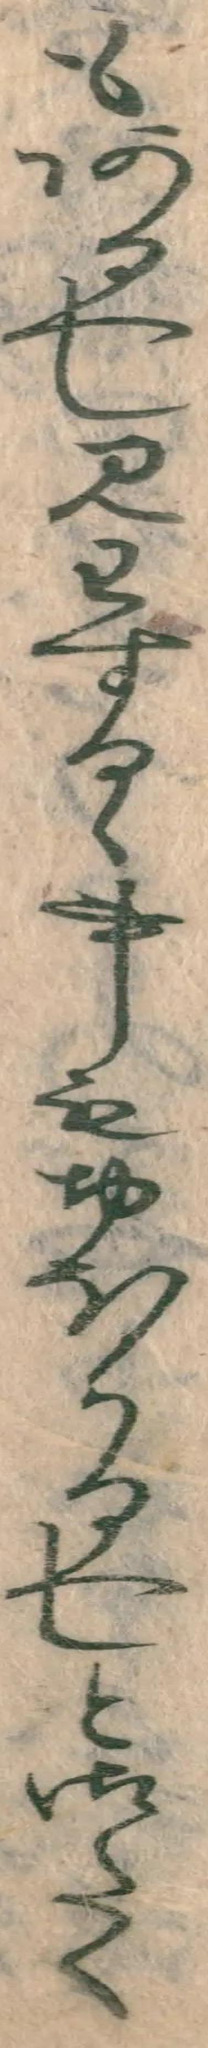もあるへし見わするゝ事もおほかるへしと御たく
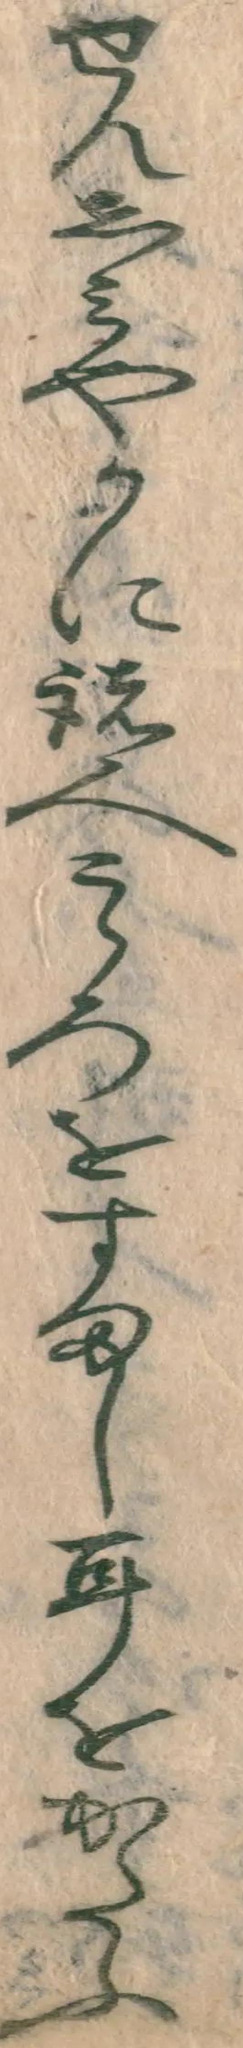せんしみやかに諸人こゝろをすまし耳をかたふ
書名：艱難目異志. 上,下
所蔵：国立国会図書館 National Diet Library, JAPAN
